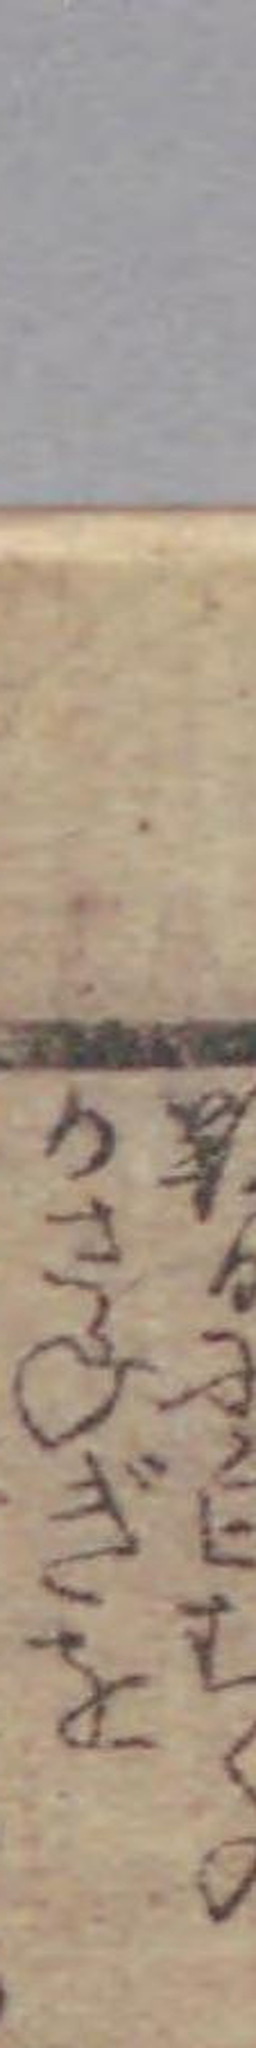かさねぎを
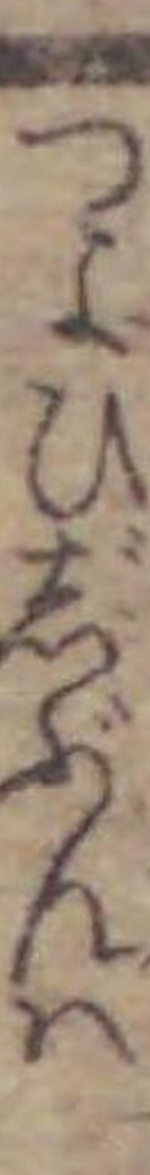つよひじぶんは
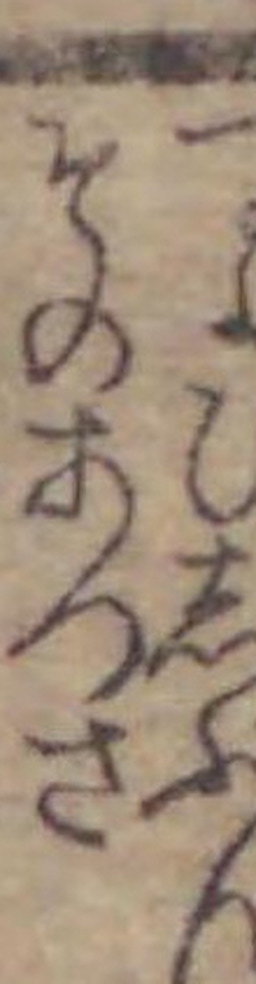そのあつさ
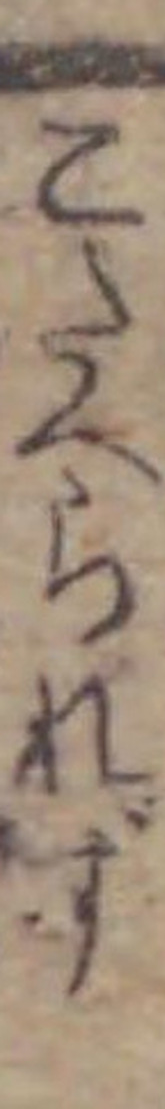こたへられず
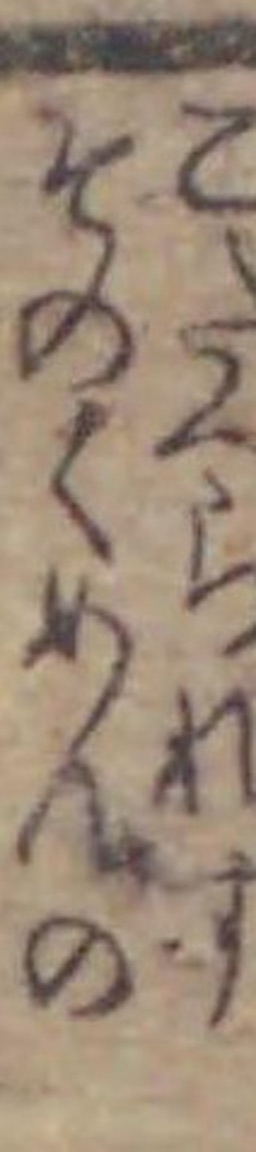そのくめんの
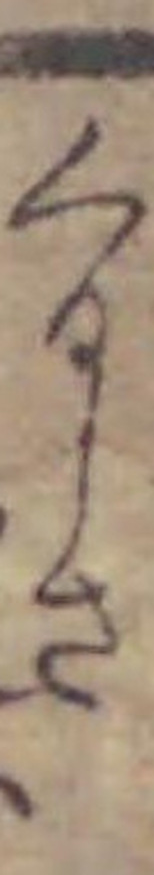くるしさ
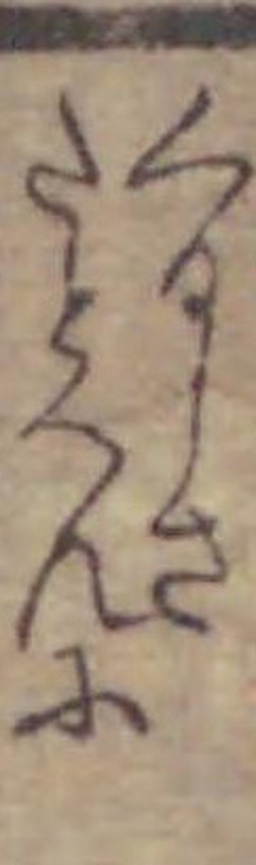たとへんに
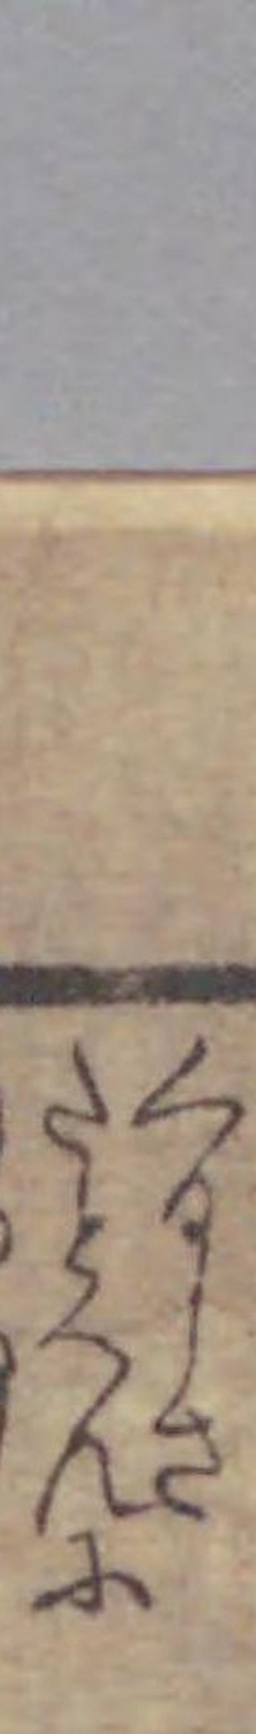たとへんに
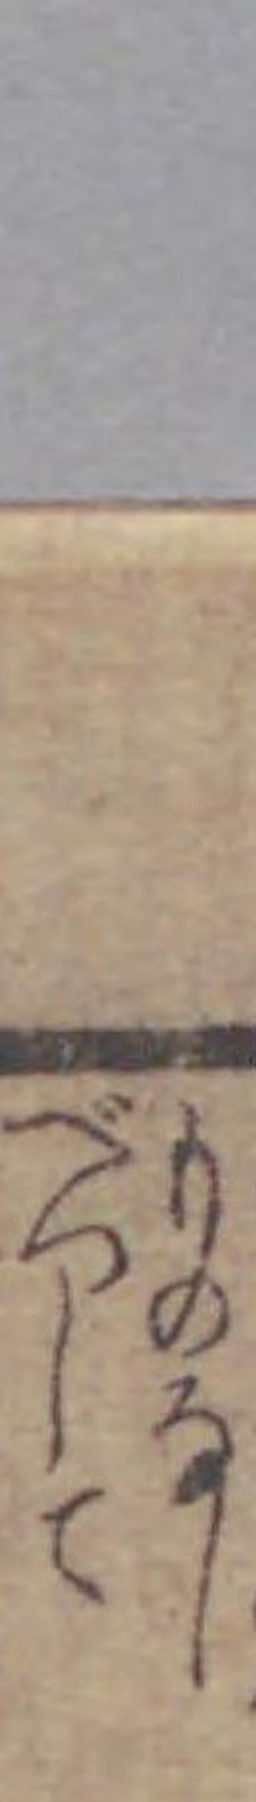べつして
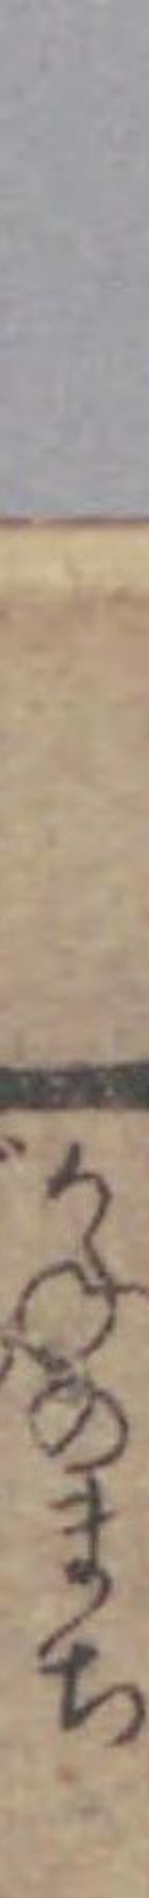かねのまち
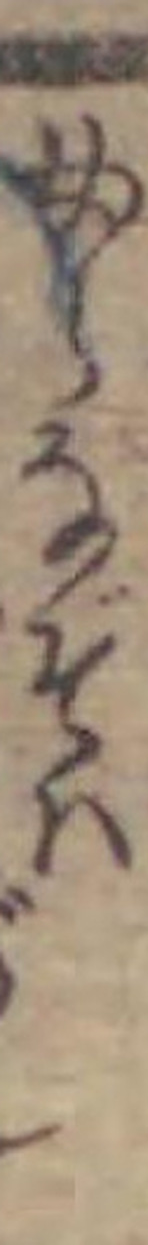女郎なぞは
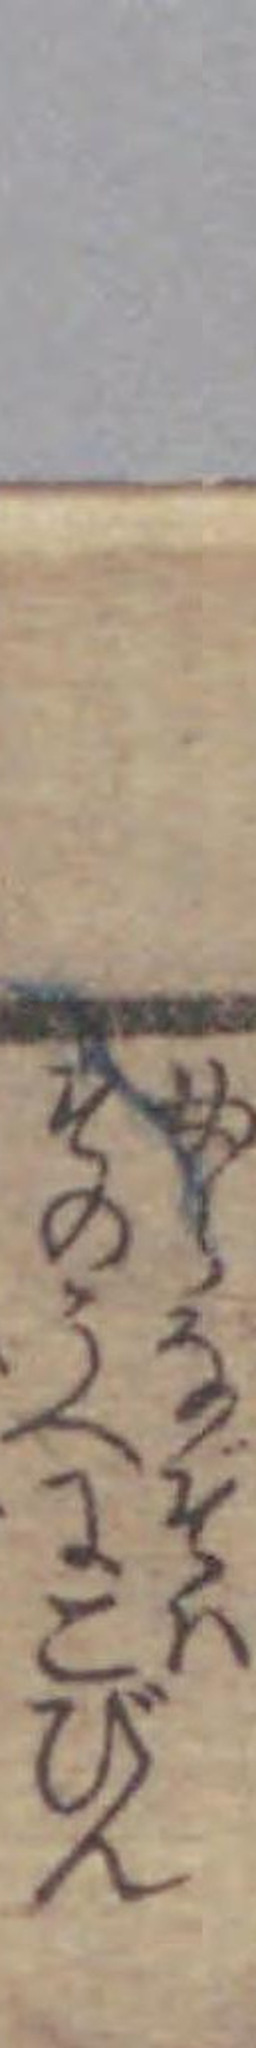そのうへにこびん
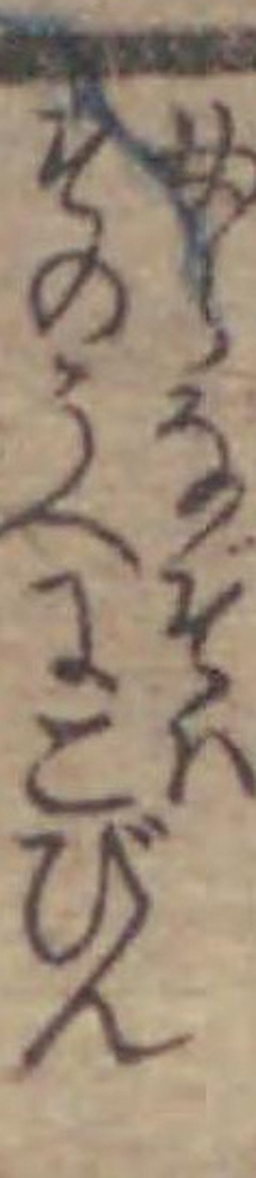そのうへにこびん
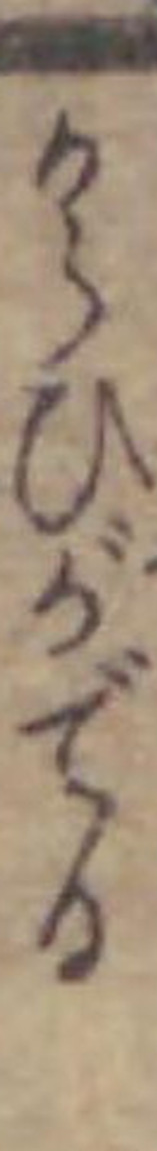からひがでる
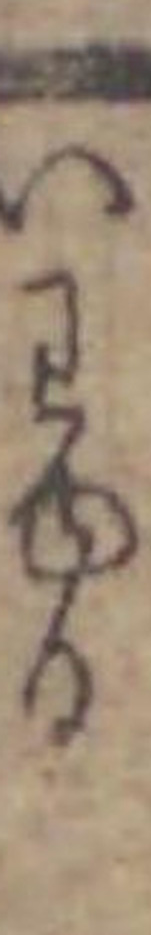いわゆる
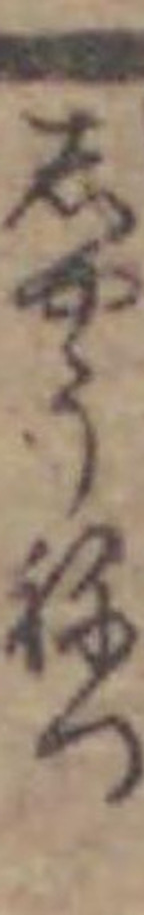しやうねつ
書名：九替十年色地獄 : 3巻
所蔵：国立国会図書館 National Diet Library, JAPAN
